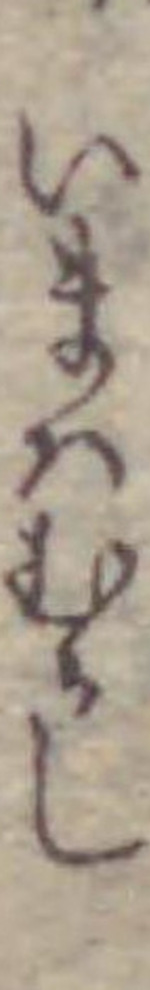いまはむかし
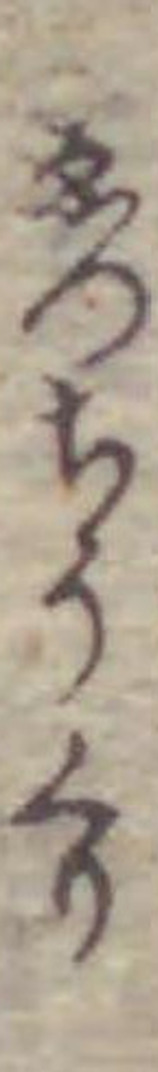ゑつちうくり
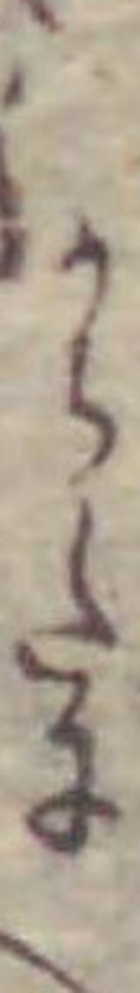からたに
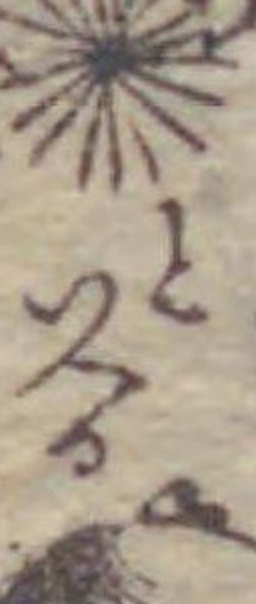いへる
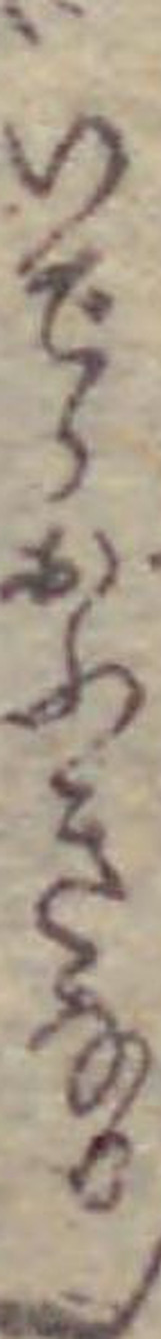いでゝおふきなる
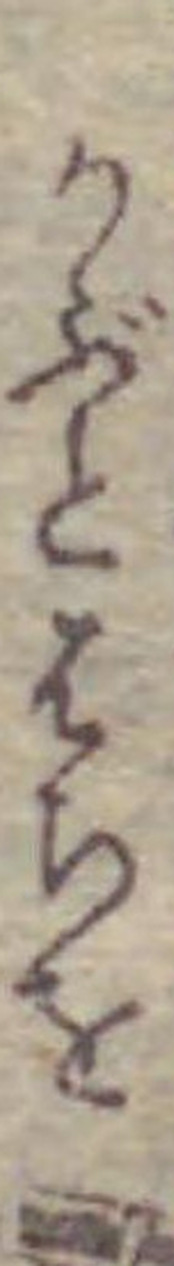かぶとはちを
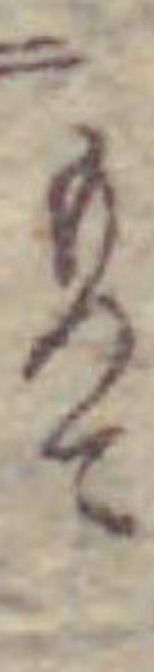もつて
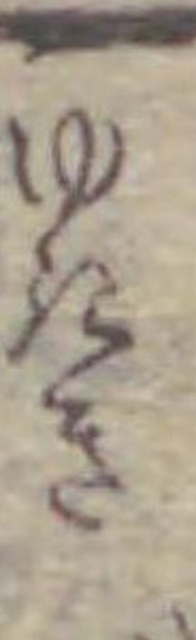ゆきき
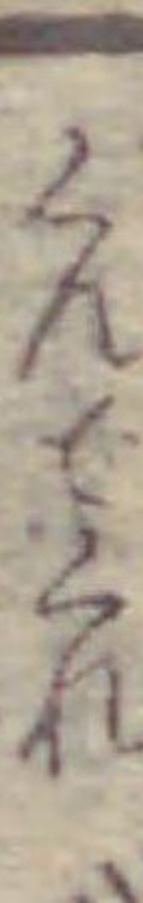くんでくれ
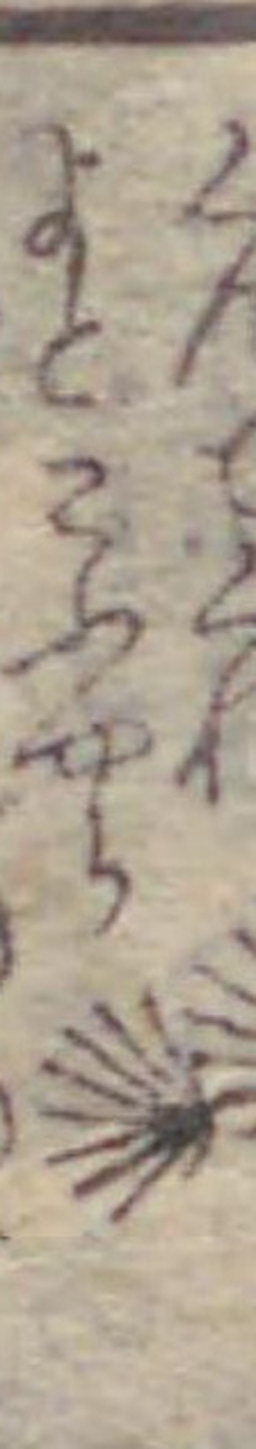よとこふやら
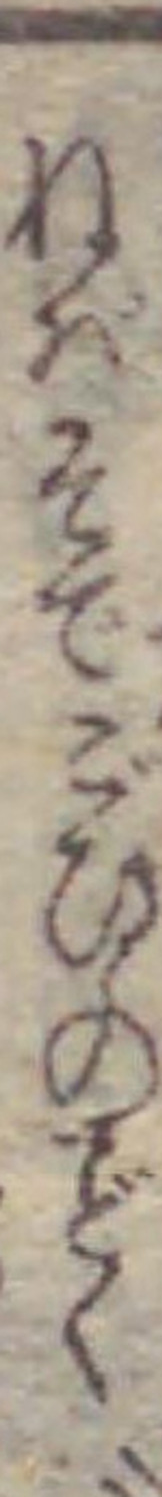ねばそでごひのごとく
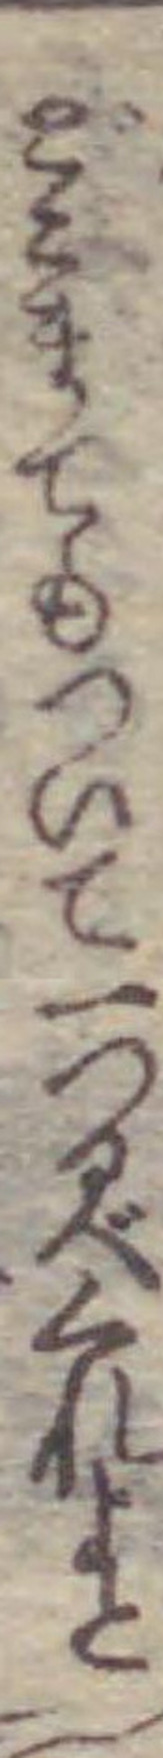どこまてもついて一つるべくれよと
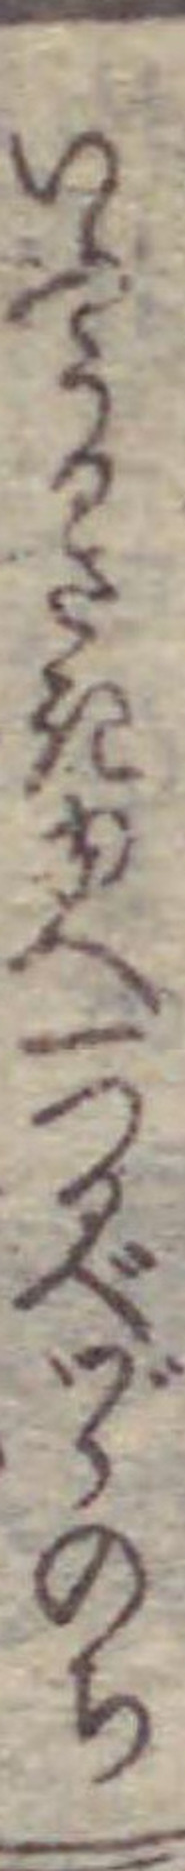いふうるさきゆへ一つるべづゝのち
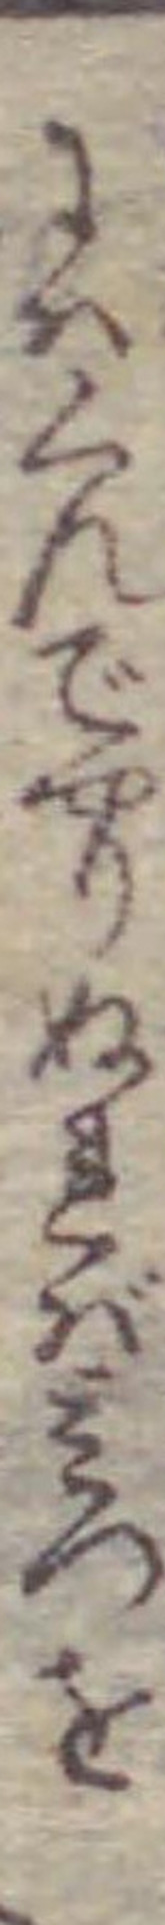にはくんでやりぬればみつを
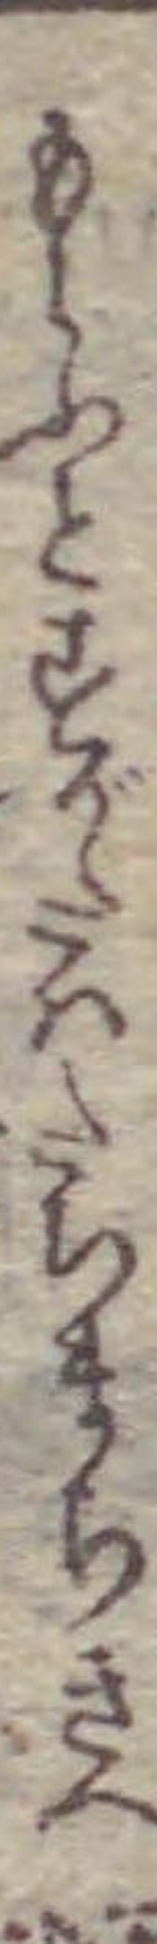もらふとすがたはたちまちきへ
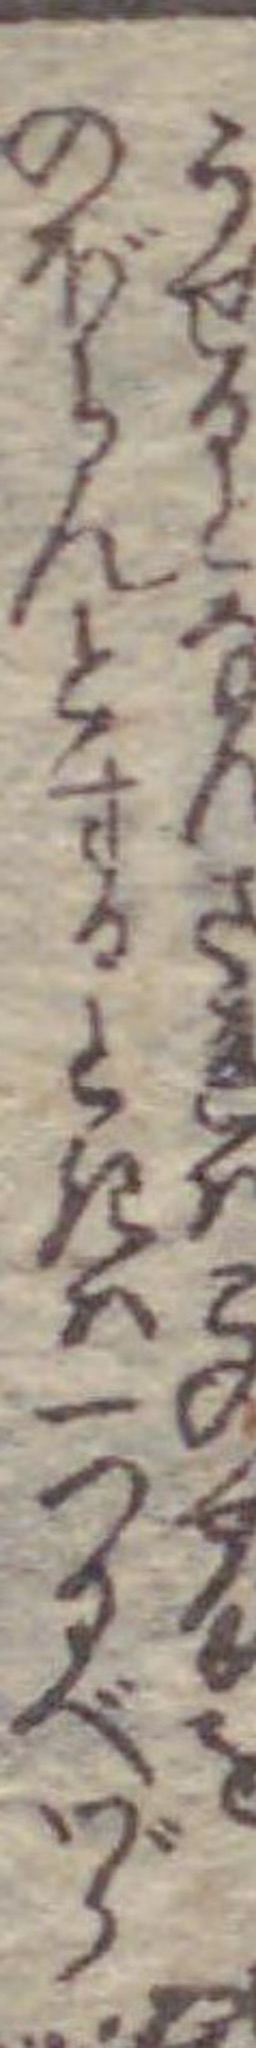のぼらんとするときは一つるべづゝ
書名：武家物奇談 : 3巻
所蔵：国立国会図書館 National Diet Library, JAPAN
